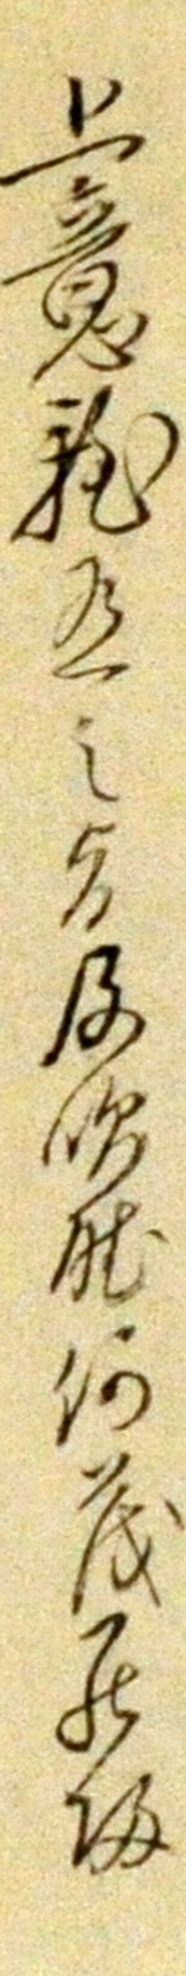上意難有之旨及吹聴何も罷帰
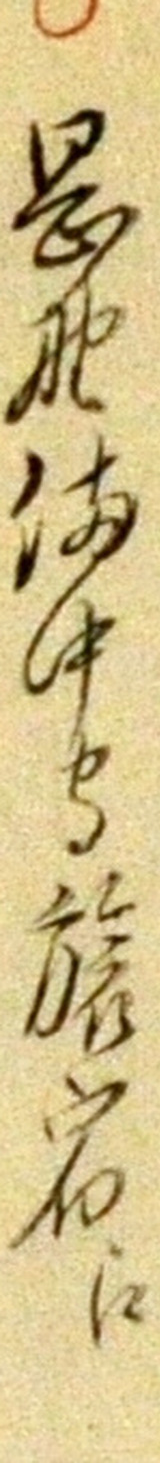岡野備中守旅宿え
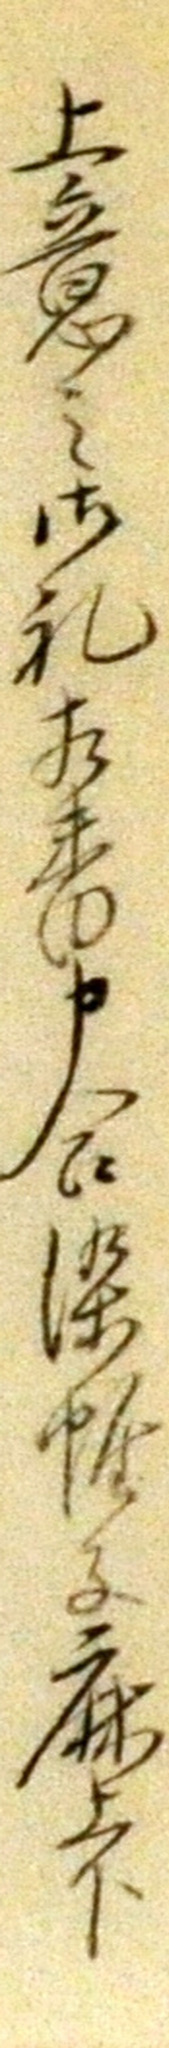上意之御礼相番申合染帷子麻上下
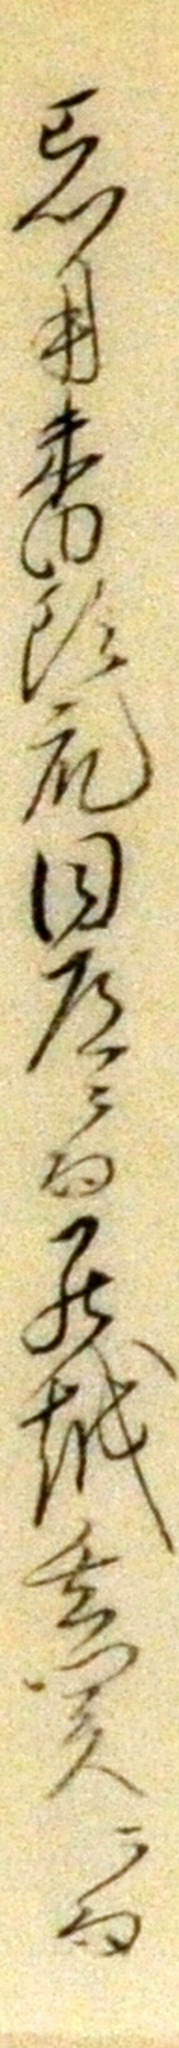着用番頭衆同道ニ而罷越玄関ニ而
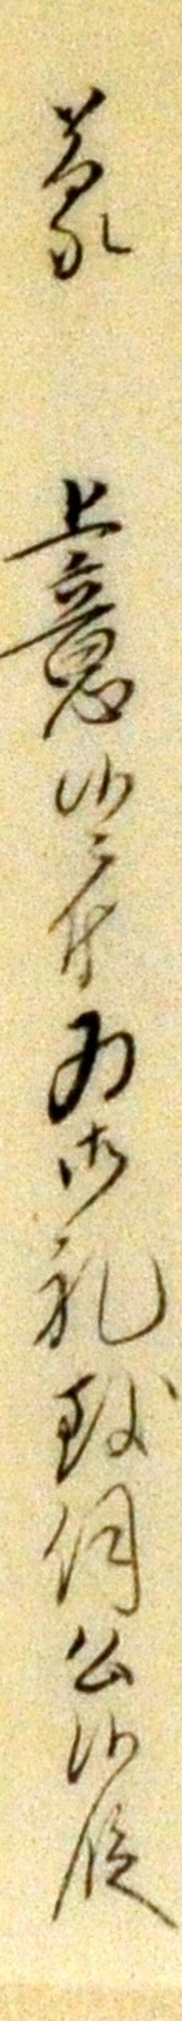蒙上意候二付為御礼致伺公候段
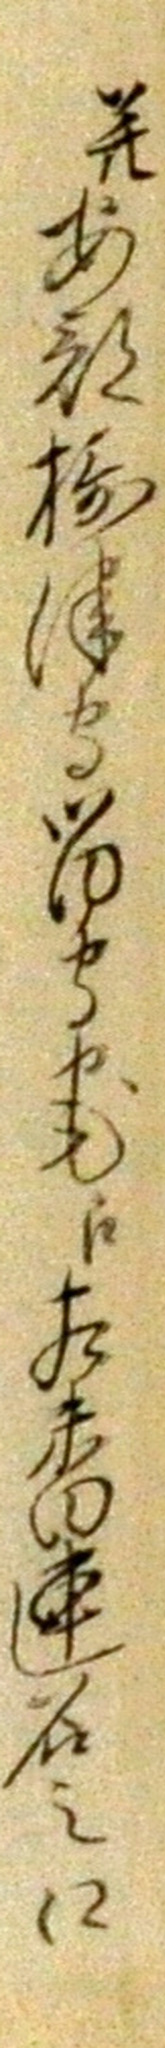并安部攝津守留守宅え相番連名之口
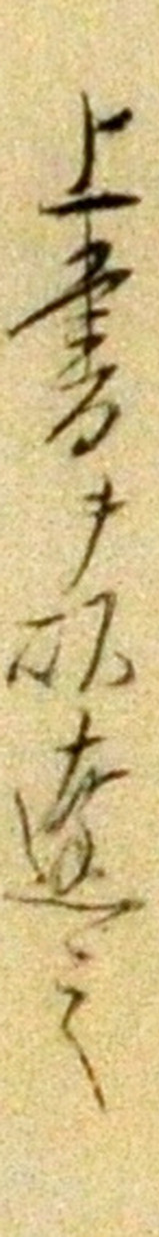上書ヲ以達之
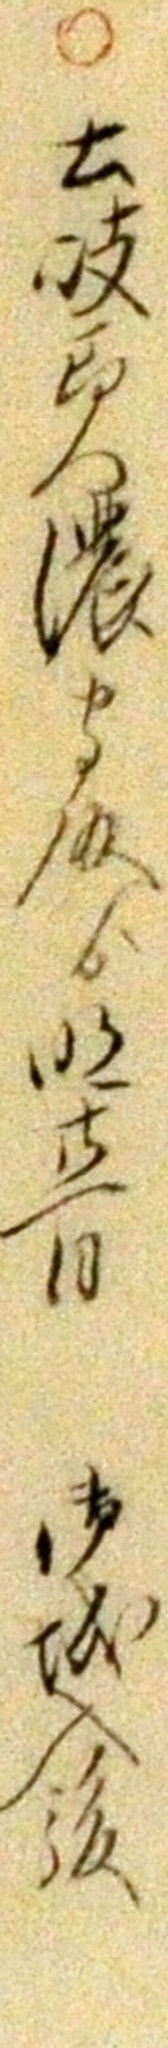土岐美濃守殿ゟ明廿一日御城入後
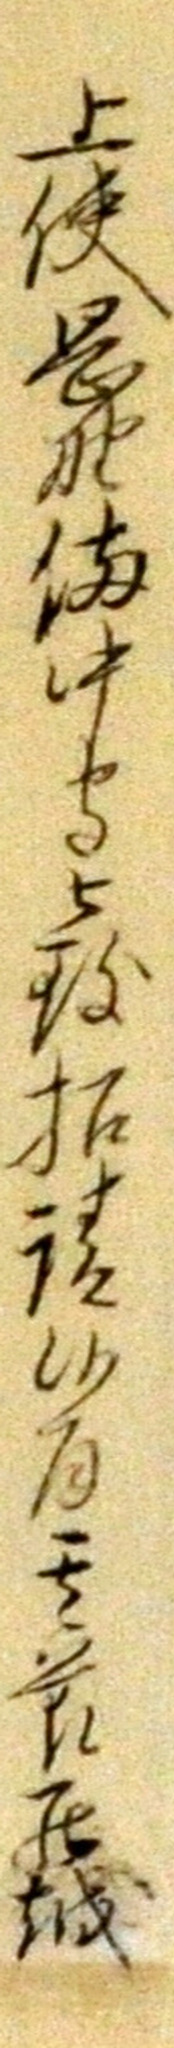上使岡野備中守被致招請候間其節罷越
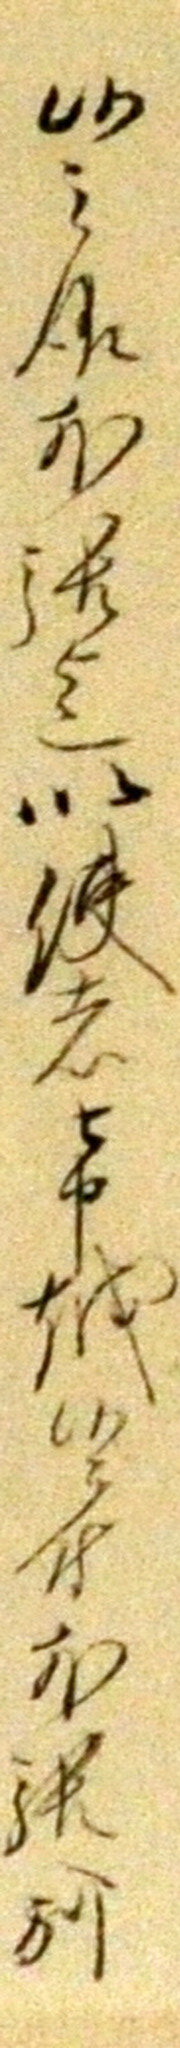候之様外張迄以使者被申越候二付外張へ別
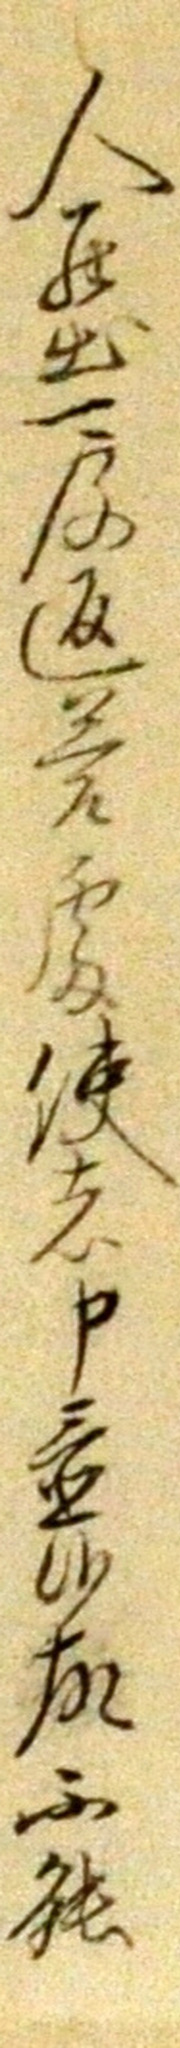人罷出可及返答処使者申置候故不能
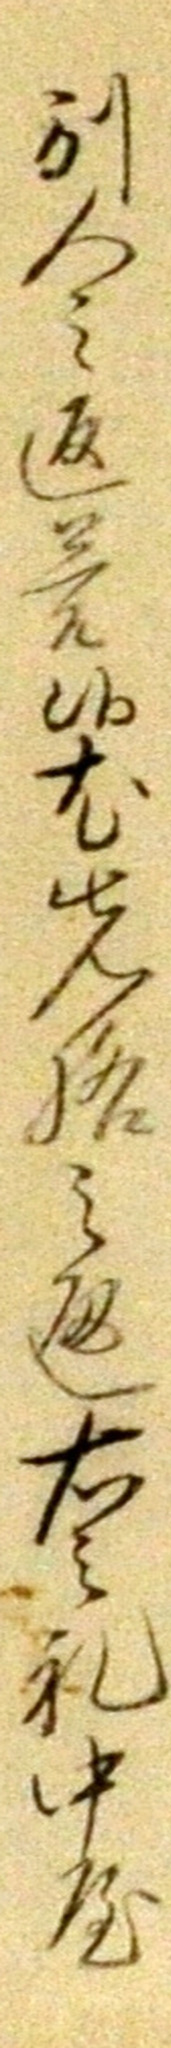別人之返答候尤先格之通右之礼中屋
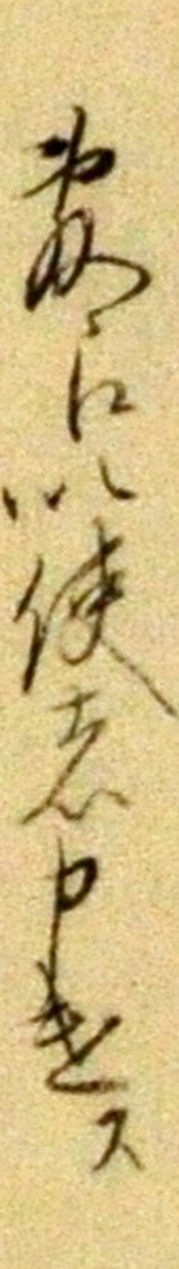敷え以使者申遣ス
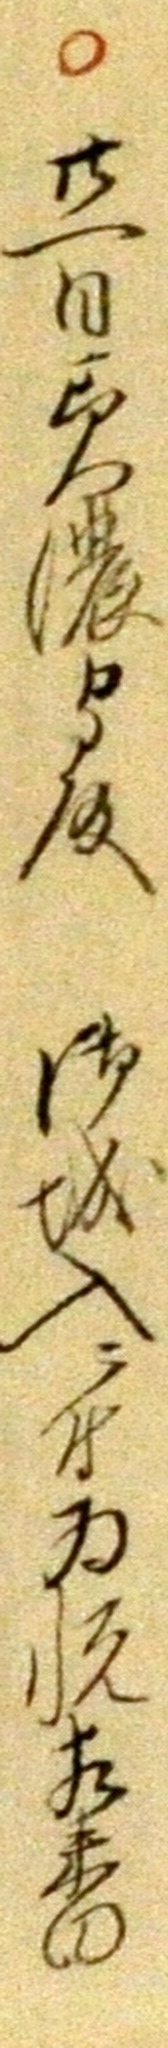廿一日美濃守殿御城入二付為悦相番
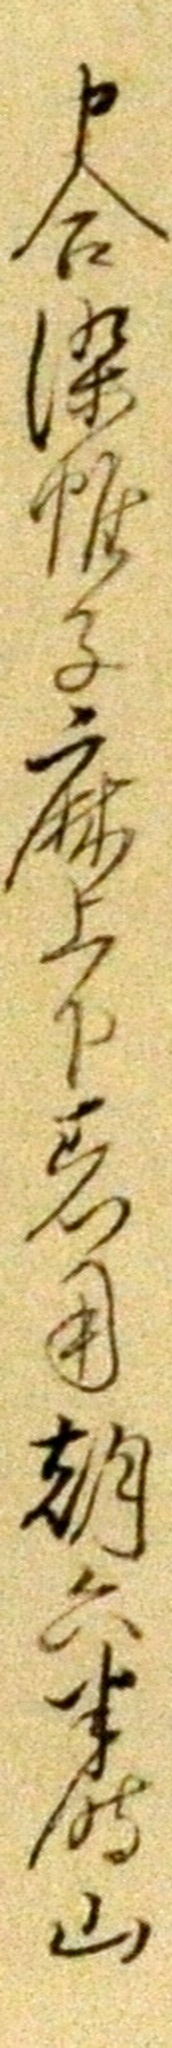申合染帷子麻上下着用朝六半時山
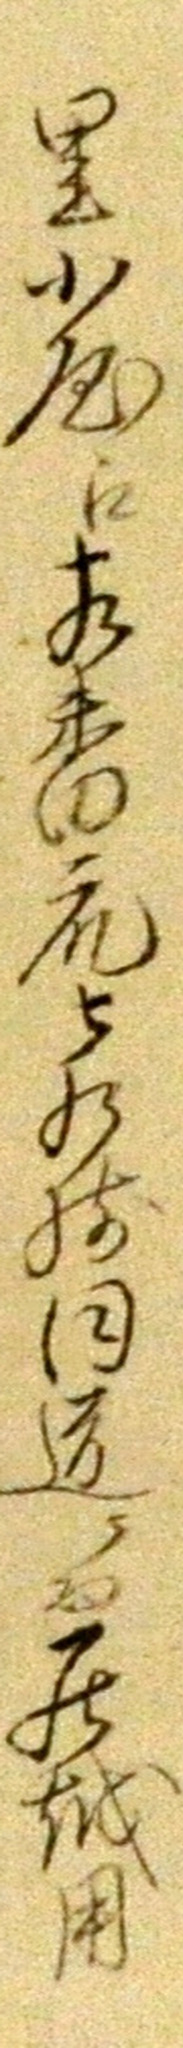里小屋え相番衆被相揃同道ニ而罷越用
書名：大阪加番関係諸書留〔一括〕
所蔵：伊那市立高遠町図書館・合同会社AMANE
